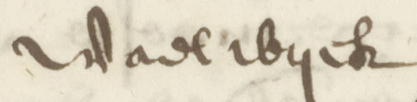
Waelwyck
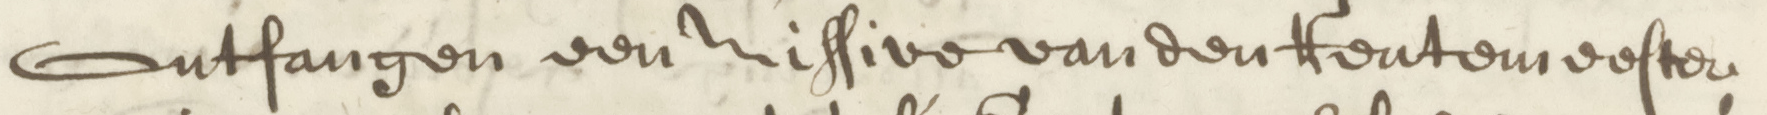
Ontfangen een Missive van den Rentemeester
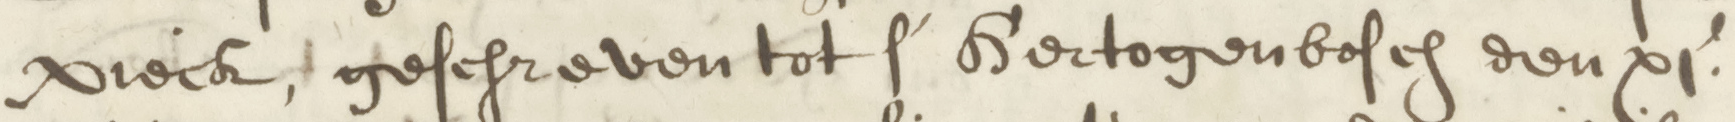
Pieck, geschreven tot s'Hertogenbosch den xie.
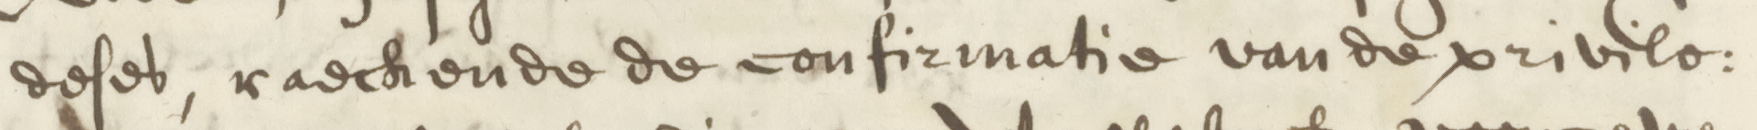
deses, raeckende de confirmatie van de privile„
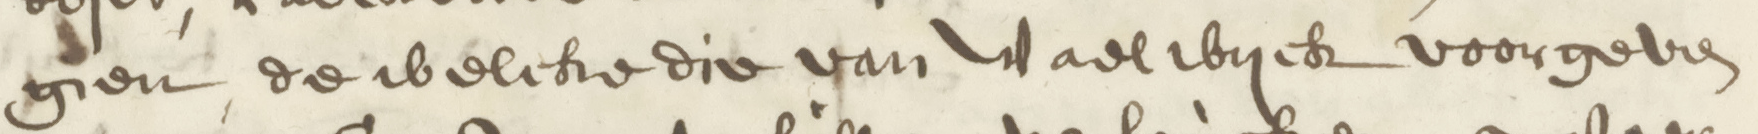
gien, de welcke die van Waelwyck voorgeven
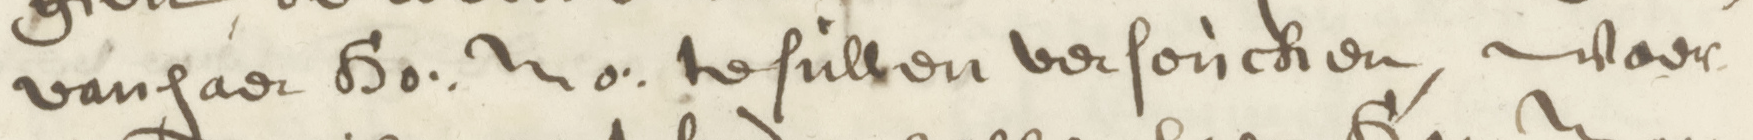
van haer Ho:Mo: te sullen versoucken, Waer
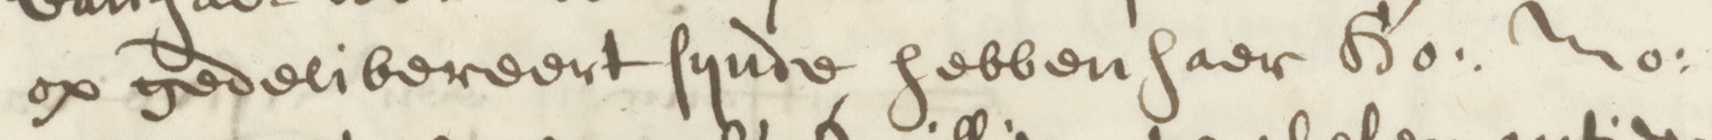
op gedelibereert synde hebben haer Ho:Mo:
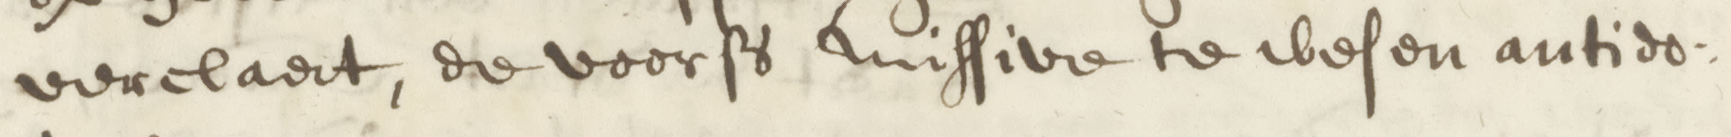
verclaert, de voors missive te wesen antido„
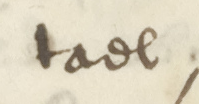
tael.
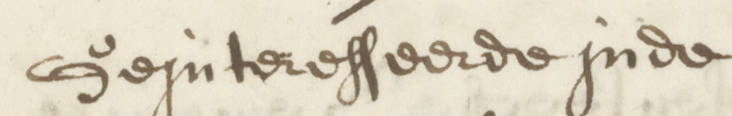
Geinteresseerde in de
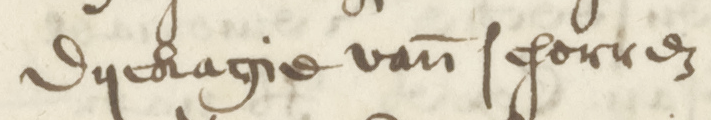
Dyckagie van schorren
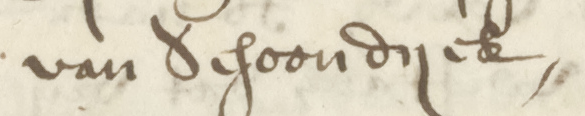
van Schoondyck,
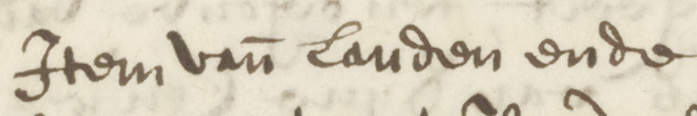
Item van Landen ende
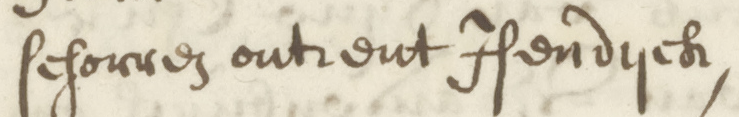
schorren ontrent Isendyck,
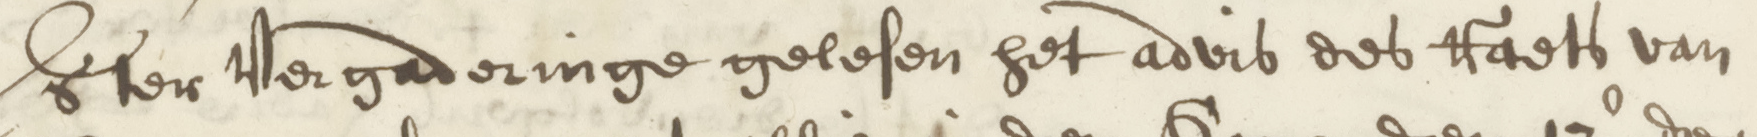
Is ter Vergaderinge gelesen het advis des Raets van
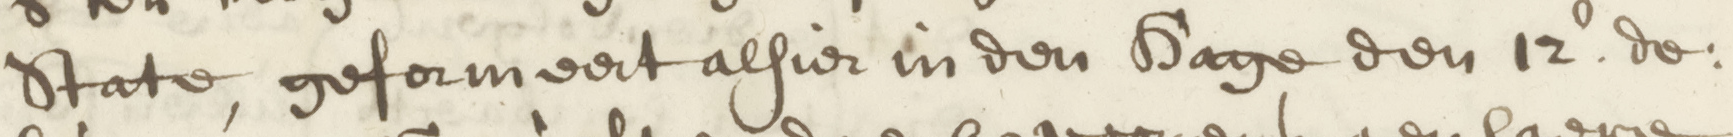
State, geformeert alhier in den Hage den 12e. de„
